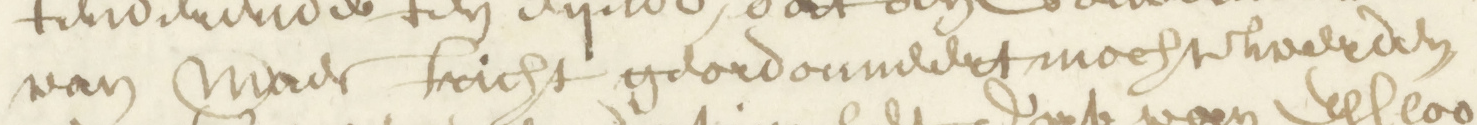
van Maestricht geordonneert mochte werden,
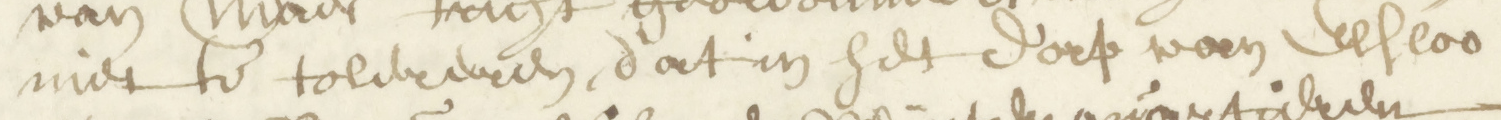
niet te tolereren, dat in het dorp van Elsloo
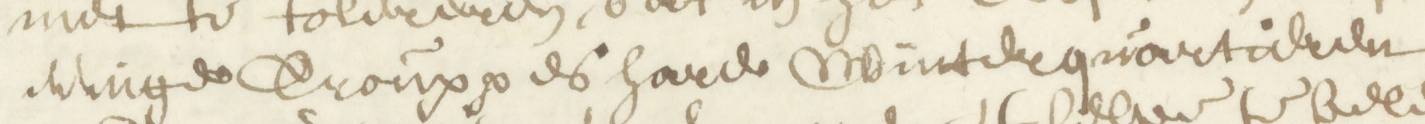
eenige Trouppes hare Winterquartieren
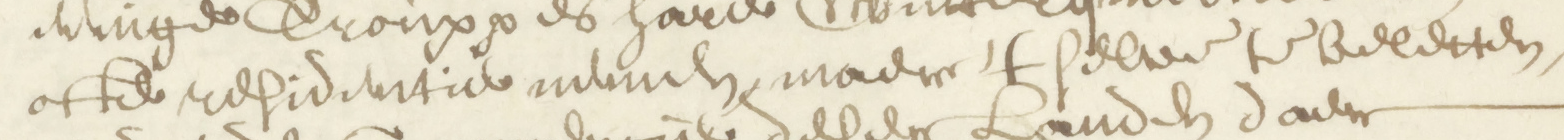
ofte residentie nemen, maer 't selve te beletten,
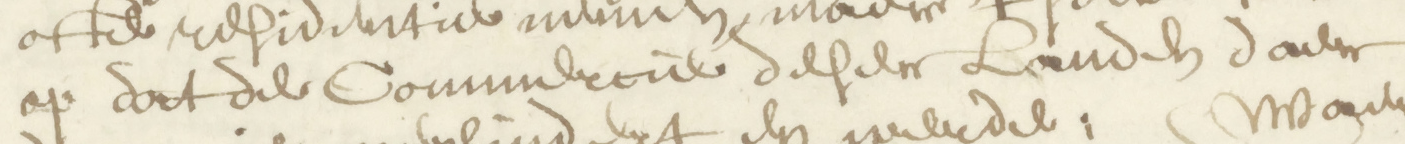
op dat de Commercie deser Landen daer
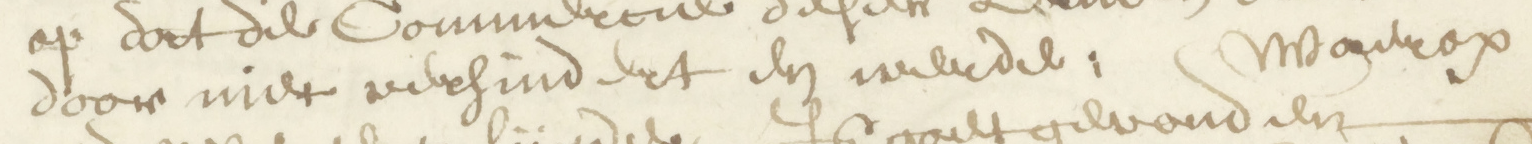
door niet verhindert en werde: Waerop
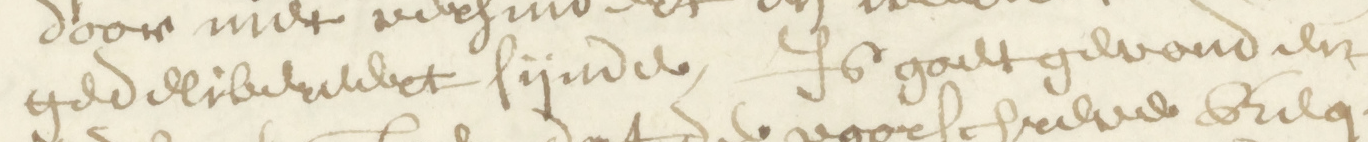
gedelibereert sijnde, Is goetgevonden
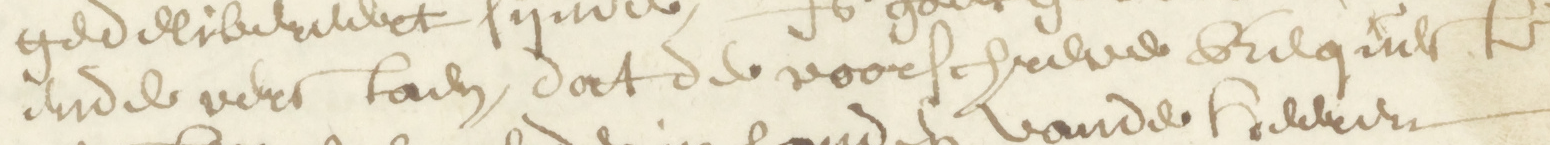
ende verstaen, dat de voorschreve Requeste
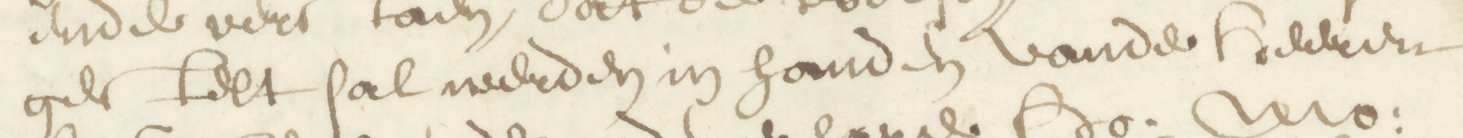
gestelt sal werden in handen vande Heeren
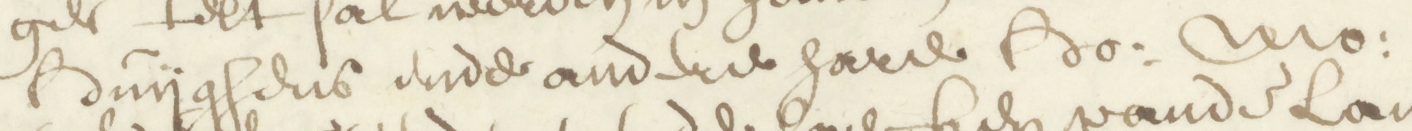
Huijghens ende andere hare Ho:Mo:
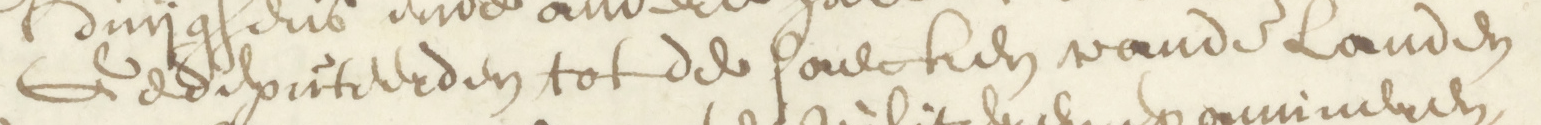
Gedeputeerden tot de saecken vande Landen
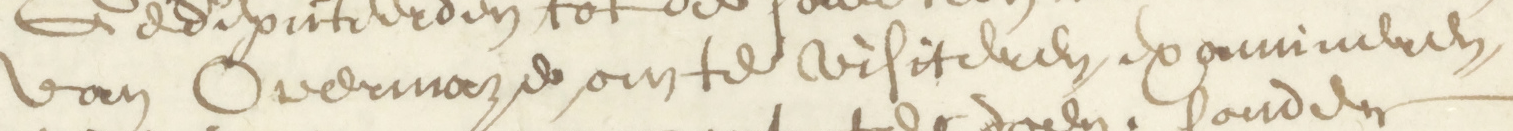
van Overmaze, om te visiteren, examineren,
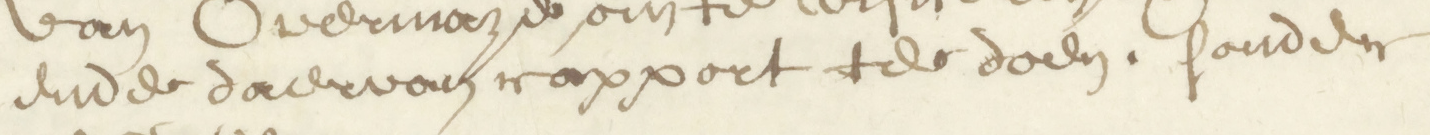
ende daervan rapport te doen, sonder
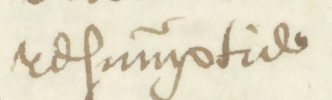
resumptie
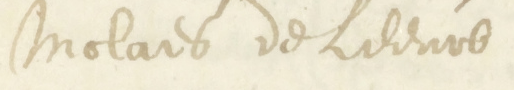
Niclaes de Leeuw
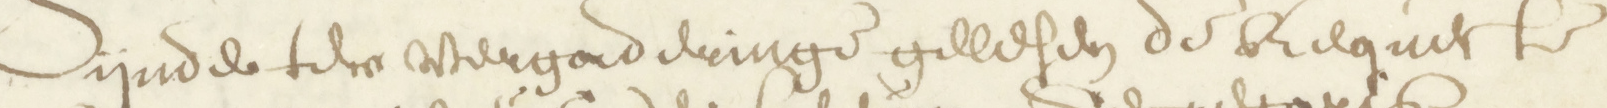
Sijnde ter vergaderinge gelesen de Requeste
